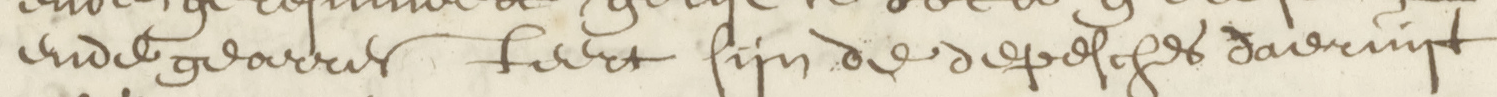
ende gearresteert sijn de depesches daeruijt
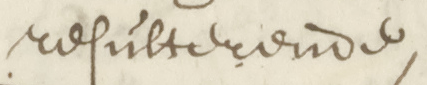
resulterende.
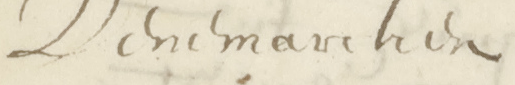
Denemarcken
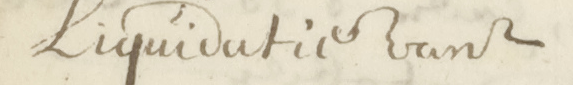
Liquidatie van
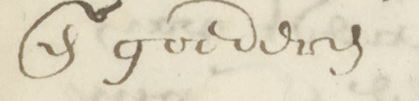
& goederen.
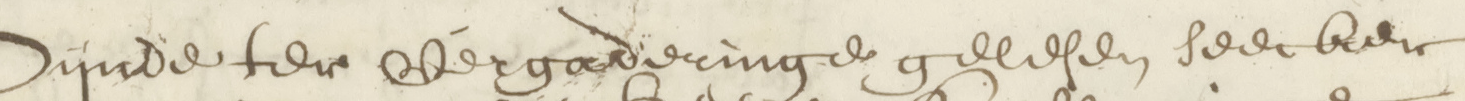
Sijnde ter Vergaderinge gelesen seecker
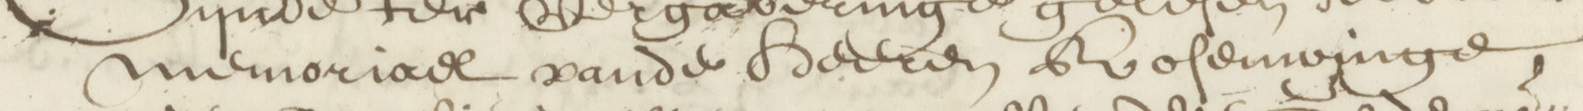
memoriael vande Heeren Rosenwinge
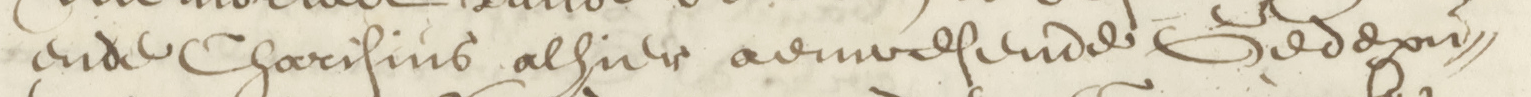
ende Charisius alhier aenwesende Gedepu„
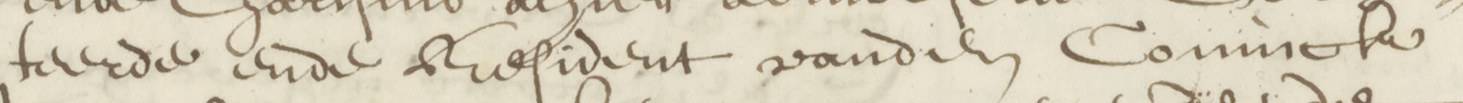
teerde ende Resident vanden Coninck
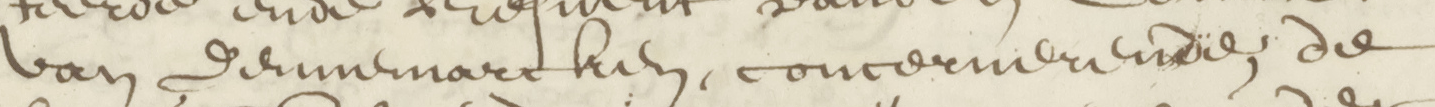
van Dennemarcken, concernerende de
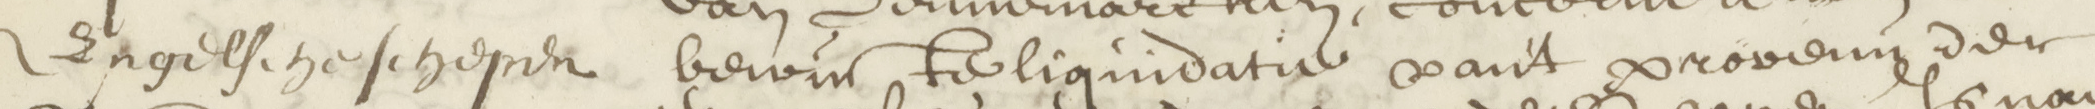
bewuste liquidatie van‛t provenu der
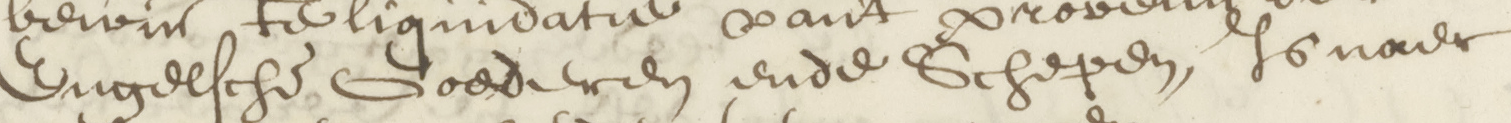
Engelsche Goederen ende Schepen. Is naer
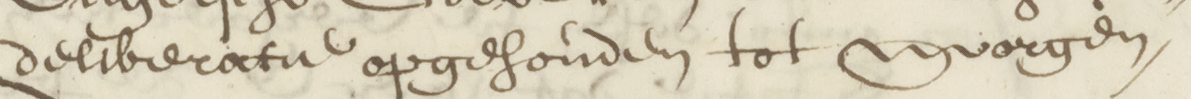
deliberatie opgehouden tot morgen.
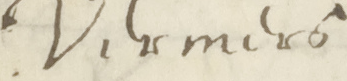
Verniers
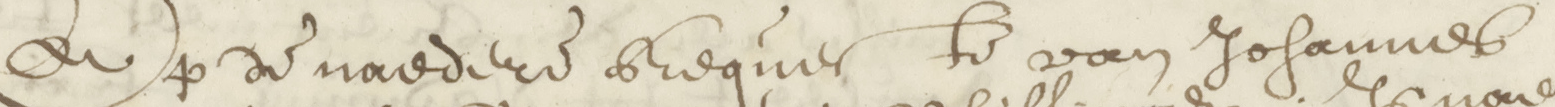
Op de naedere Requeste van Johannes
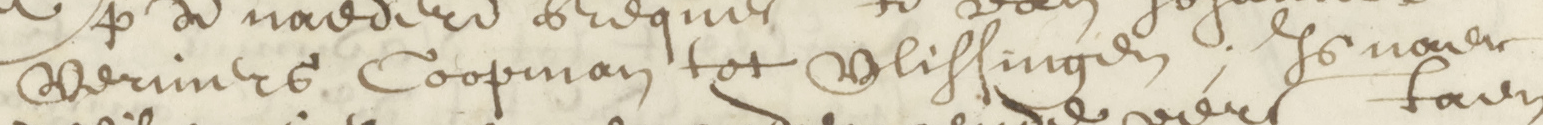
Verniers Coopman tot Vlissingen; Is naer
